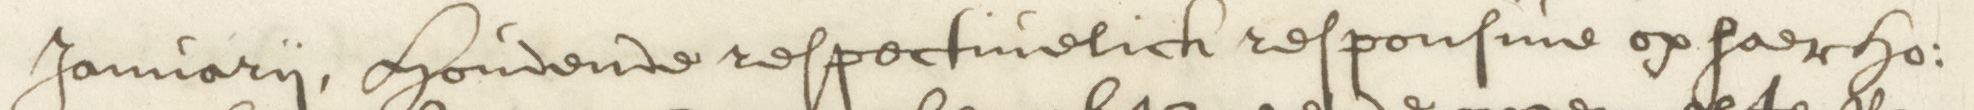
Januarij, houdende respectiuelick responsiue op haer Ho:
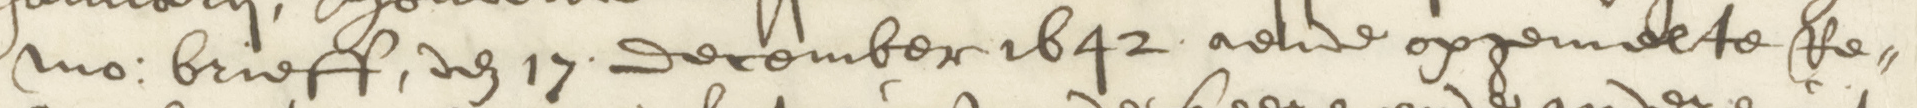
Mo: brieff, den 17. December 1642. aende opgemelte Re„
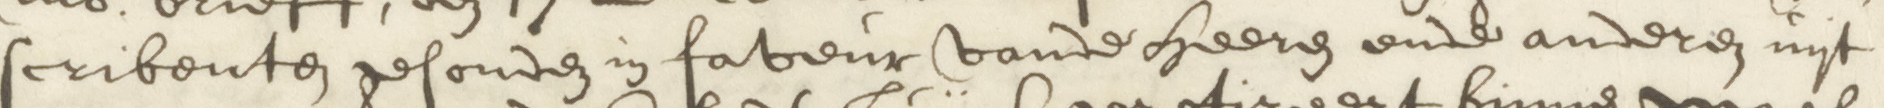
scribenten gesonden in faveur vande heeren ende anderen uijt
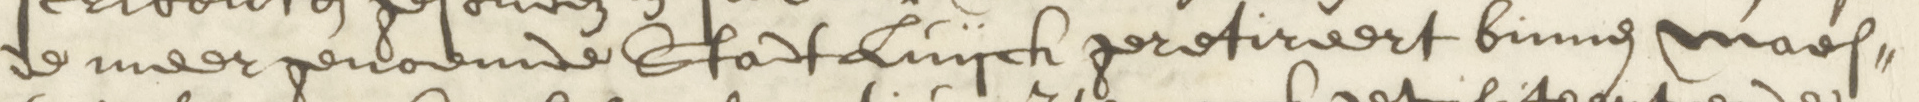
de meergenoemde Stadt Luijck geretireert binnen Maes„
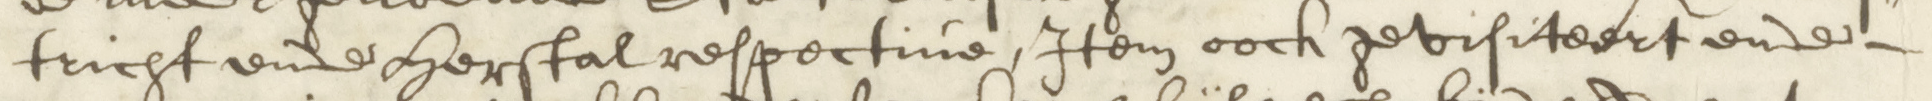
tricht ende Herstal respectiuve. Item oock gevisiteert ende —
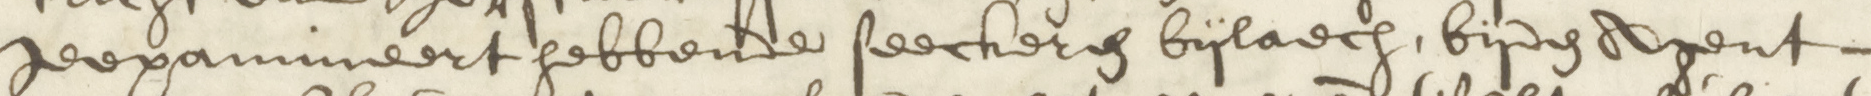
geexamineert hebbende seeckeren bijlaech, bijden Agent —
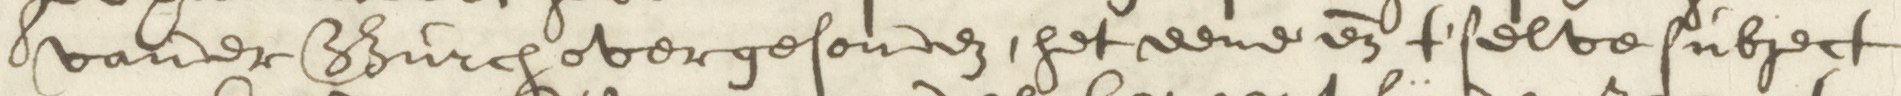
vander Burch overgesonden, het eene en t'selve subject
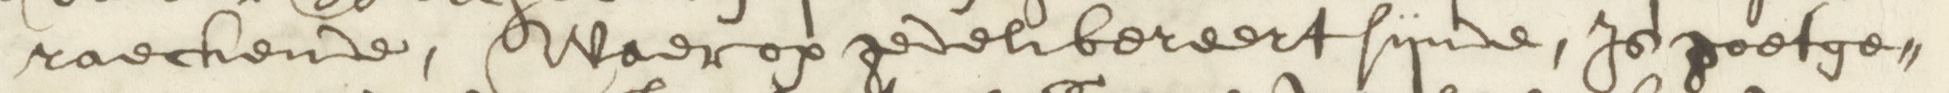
raeckende. Waerop gedelibereert sijnde, Is goetge„
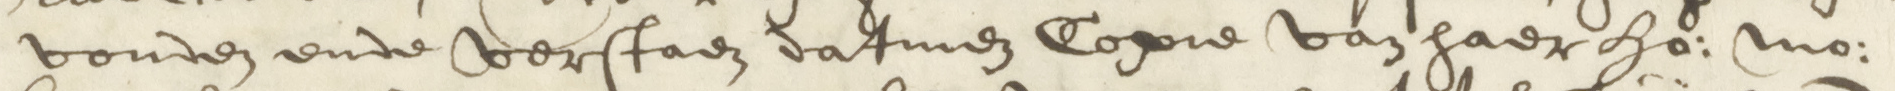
vonden ende verstaen datmen Copie van haer Ho:Mo:
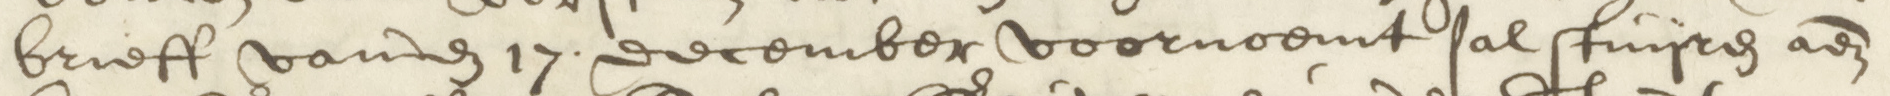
brieff vanden 17. december voornoemt sal stuijren aen
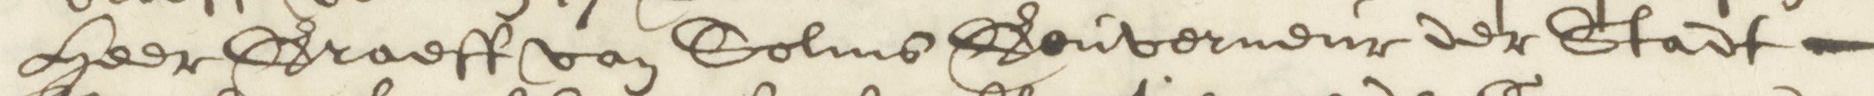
heer Graeff van Solms Gouverneur der Stadt —
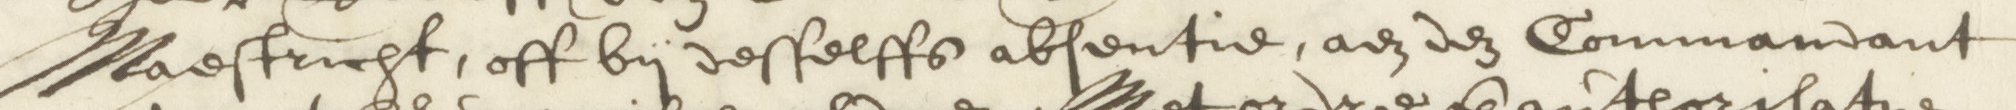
Maestricht, off bij desselffs absentie, aen den Commandant
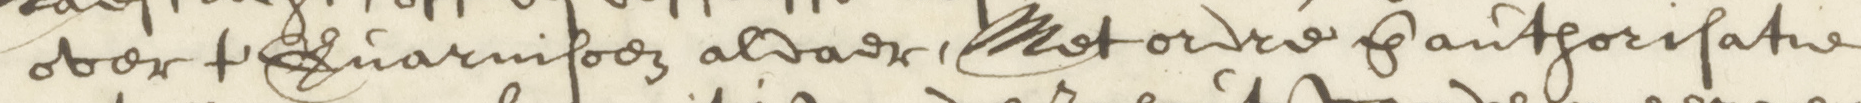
over t‛Guarnisoen aldaer, Met ordre & authorisatie
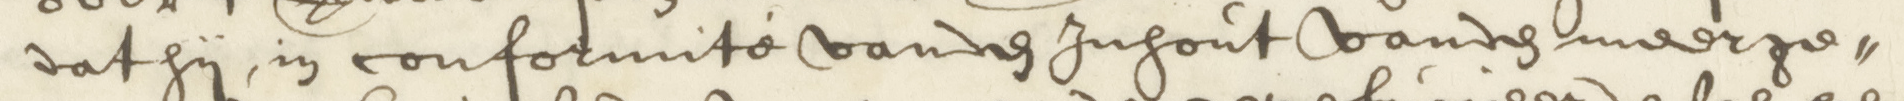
dat hij, in conformité vanden Inhout vanden meerge„
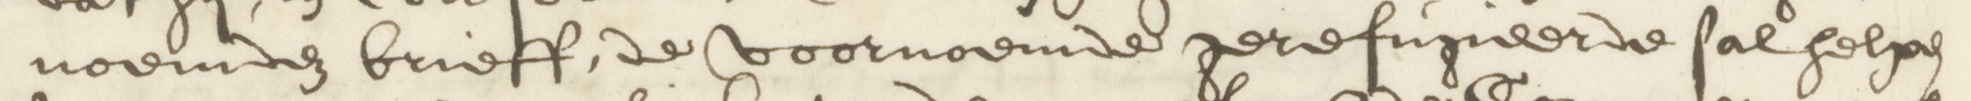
noemden brieff, de voornoemde gerefugieerde sal helpen
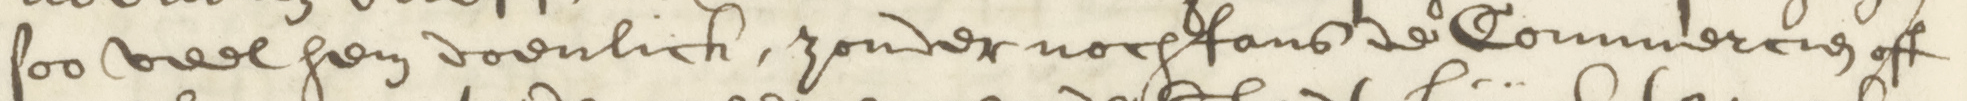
soo veel hem doenlick, zonder nochtans de Commercien off
